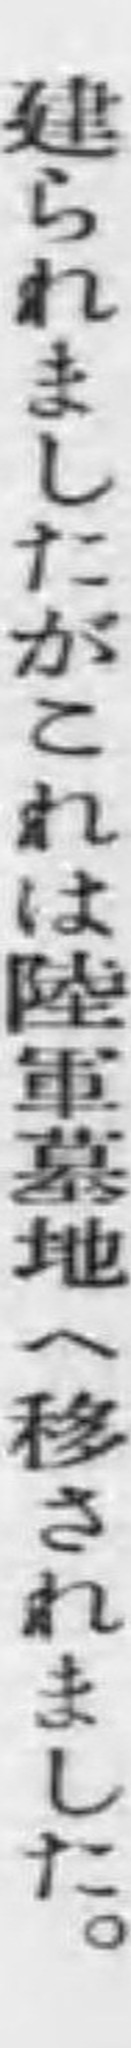建られましたがこれは陸軍墓地へ移されました。
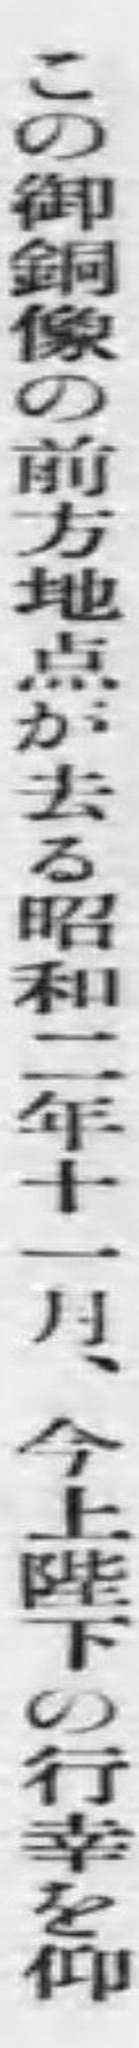この御銅像の前方地点が去る昭和二年十一月、今上陛下の行幸を仰
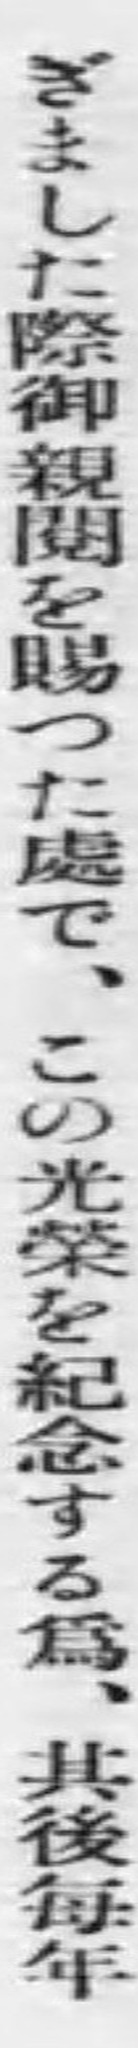ぎました際御親閲を賜つた処で、この光栄を紀念する為、其後毎年
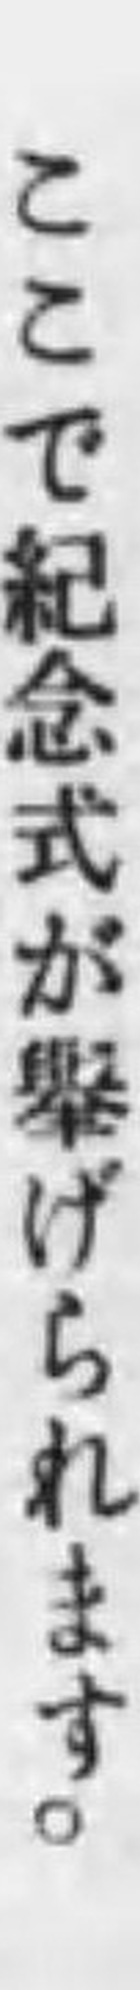ここで紀念式が挙げられます。
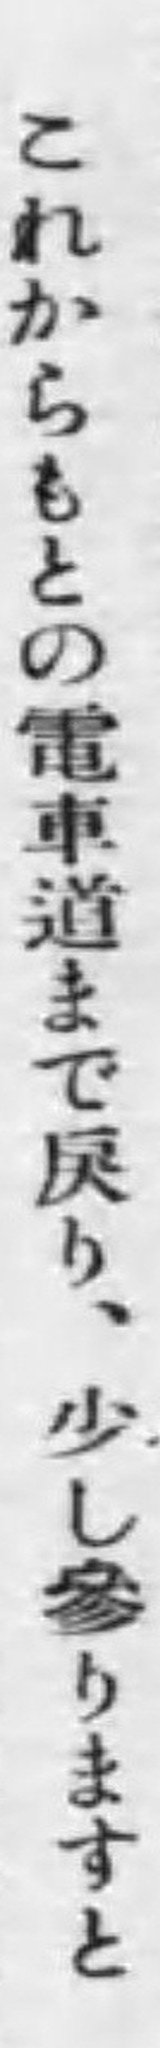これからもとの電車道まで戻り、少し参りますと
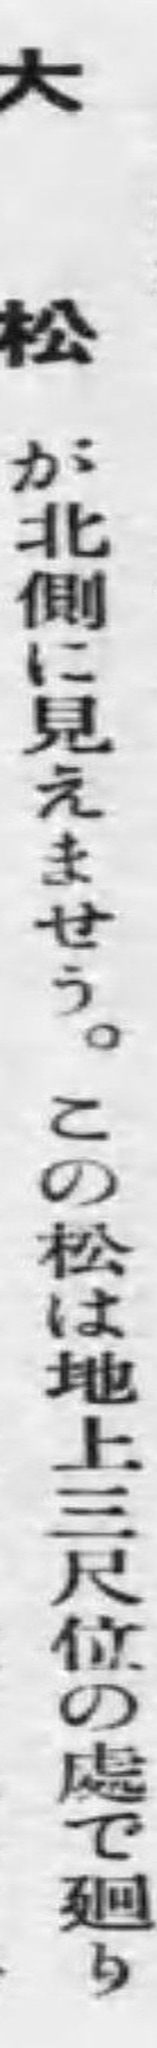大松が北側に見えませう。この松は地上三尺位の処で廻り
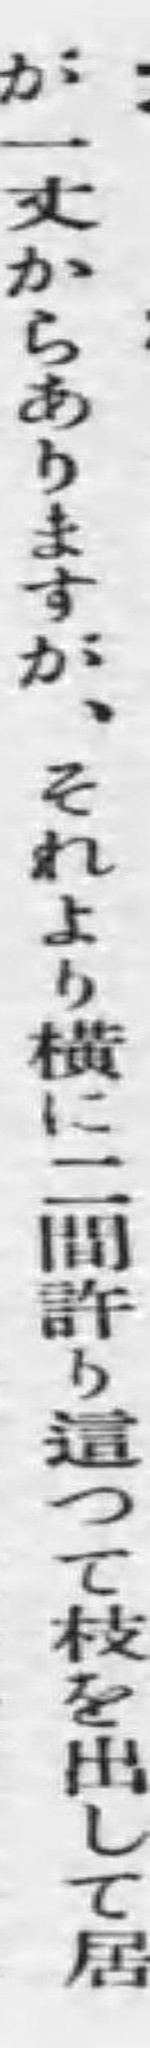が一丈からありますが、それより横に二間許り這つて枝を出して居
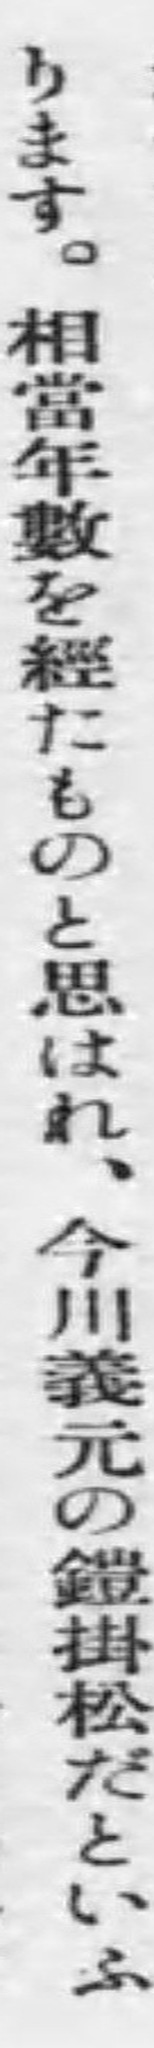ります。相当年数を経たものと思はれ、今川義元の鎧掛松だといふ
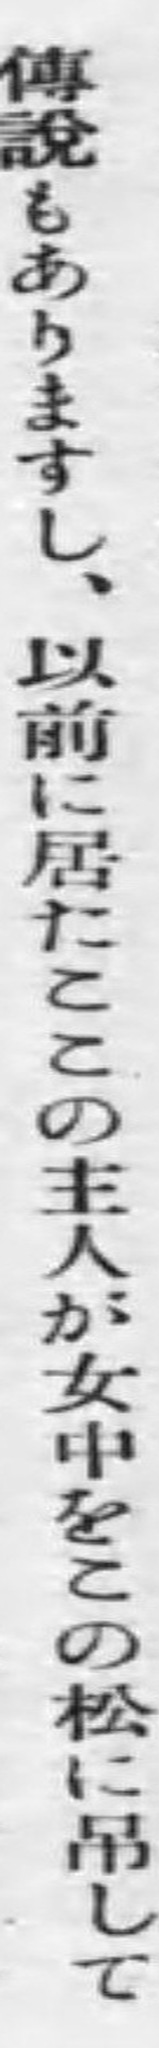伝説もありますし、以前に居たここの主人が女中をこの松に吊して
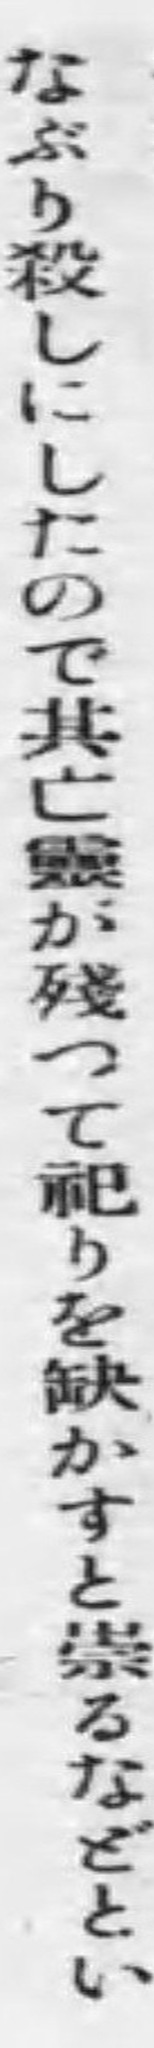なぶり殺しにしたので其亡霊が残つて祀りを欠かすと崇るなどとい
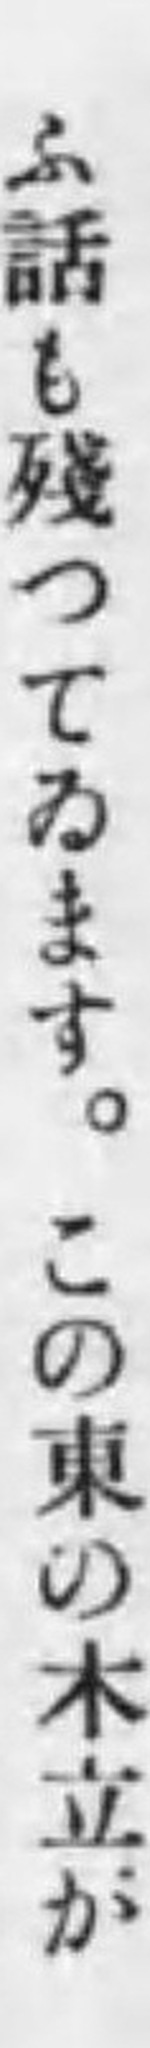ふ話も残つてゐます。この東の木立が
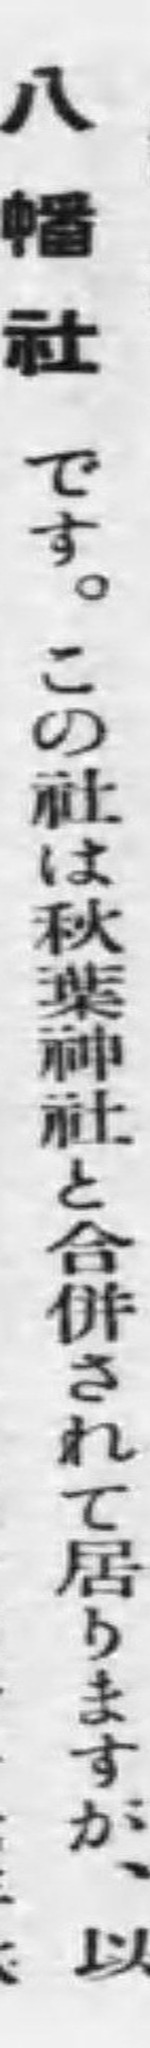八幡社です。この社は秋葉神社と合併されて居りますが、以
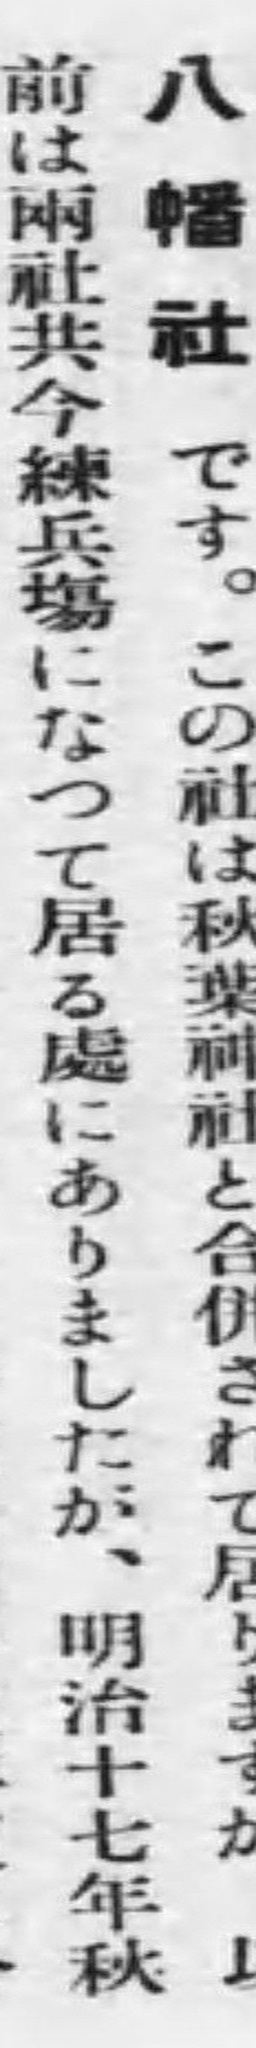前は両社共今練兵場になつて居る処にありましたが、明治十七年秋
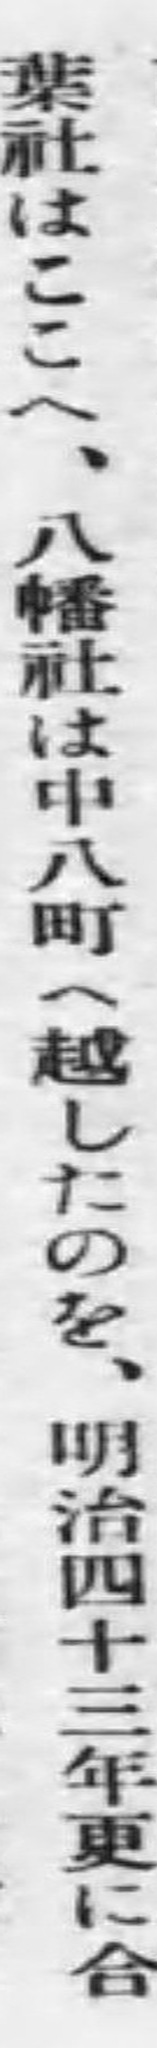葉社はここへ、八幡社は中八町へ越したのを、明治四十三年更に合
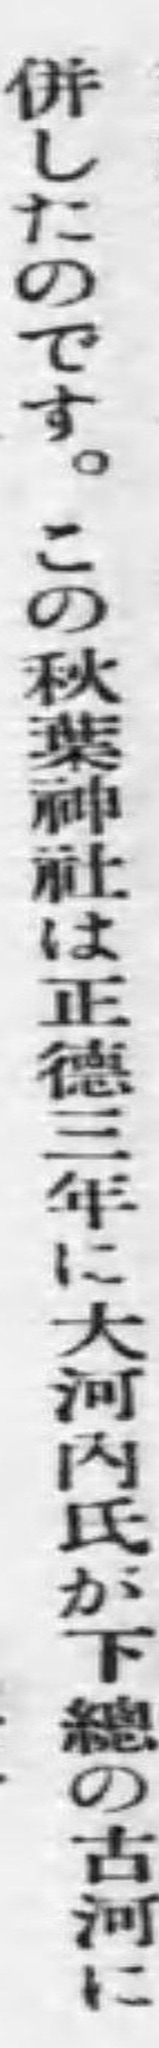併したのです。この秋葉神社は正徳三年に大河内氏が下総の古河に

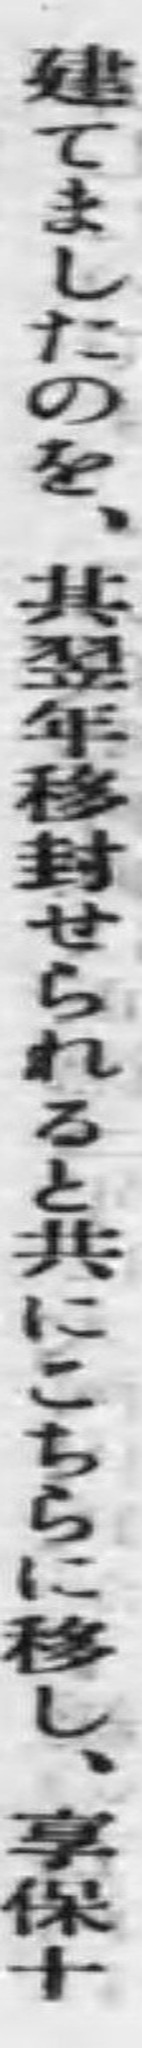建てましたのを、其翌年移封せられると共にこちらに移し、享保十
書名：東三河道中記 : 豊橋市及其附近案内
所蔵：国立国会図書館 National Diet Library, JAPAN
